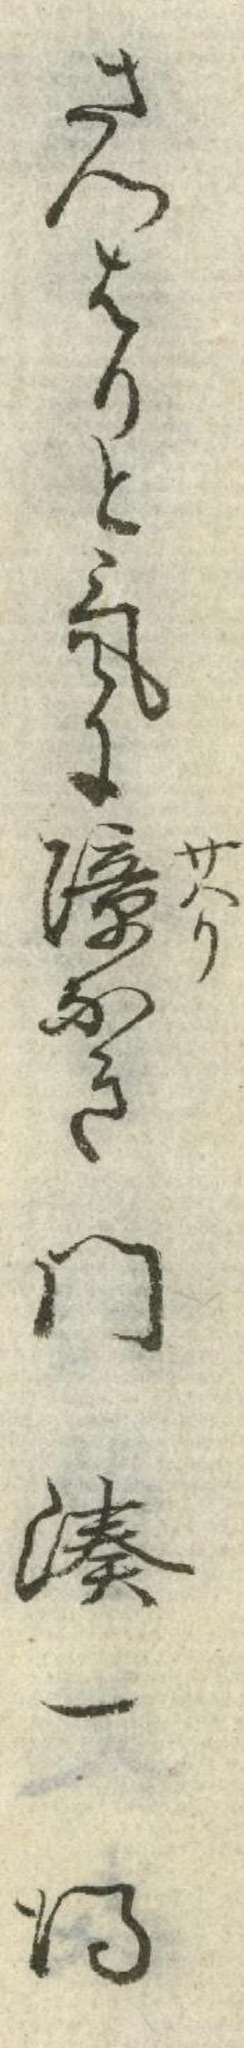さつはりと気に障なき門湊一得
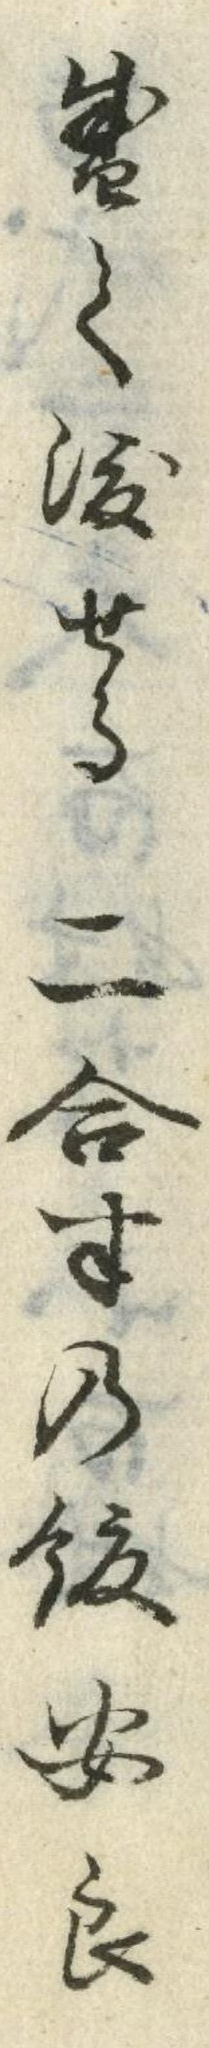盛て渡せる二合半の飯安良
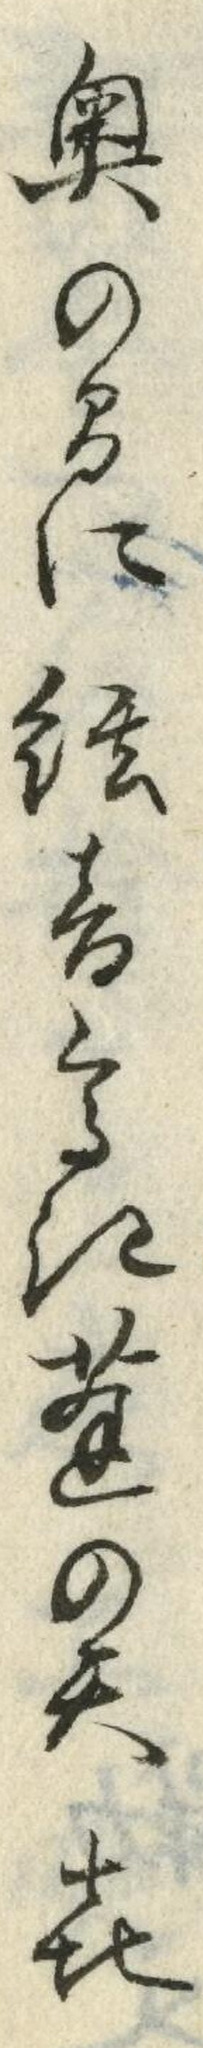奥の間に絃音高き蓬の矢喜
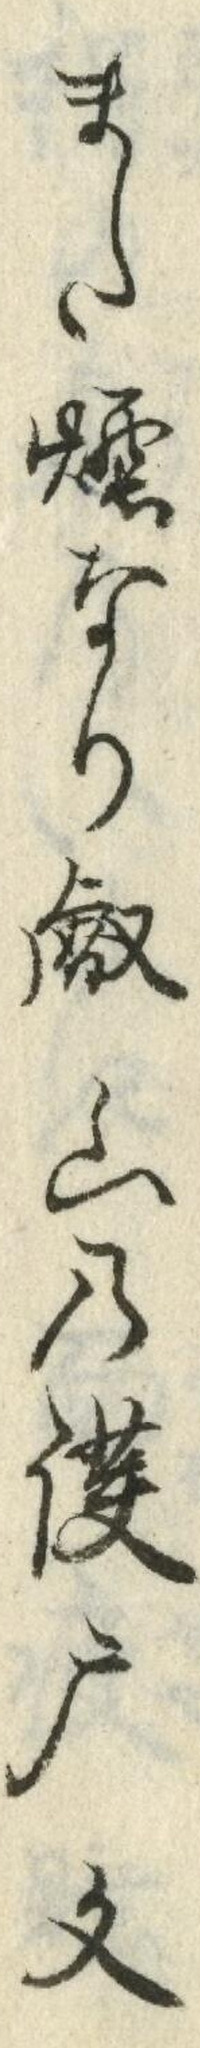また煙なり叡山の護摩文
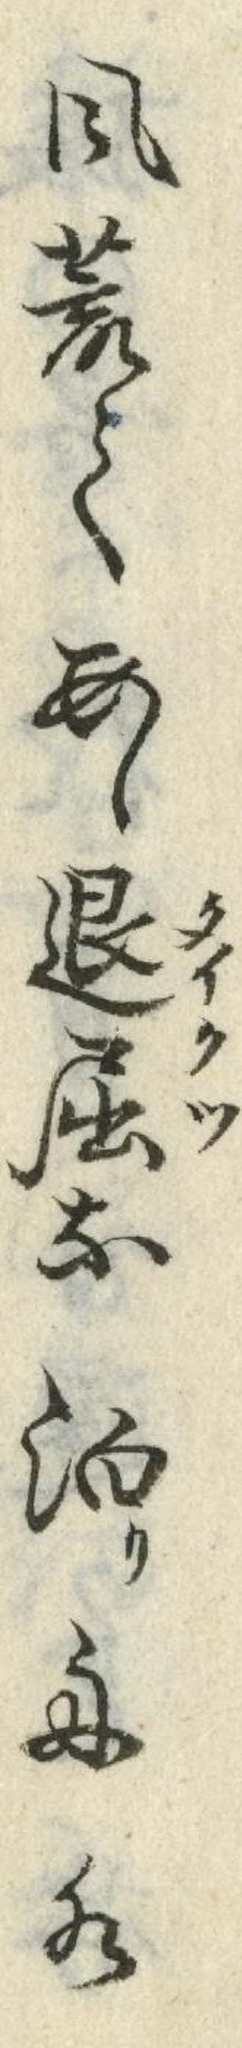風荒てあゝ退屈な泊リ舟水
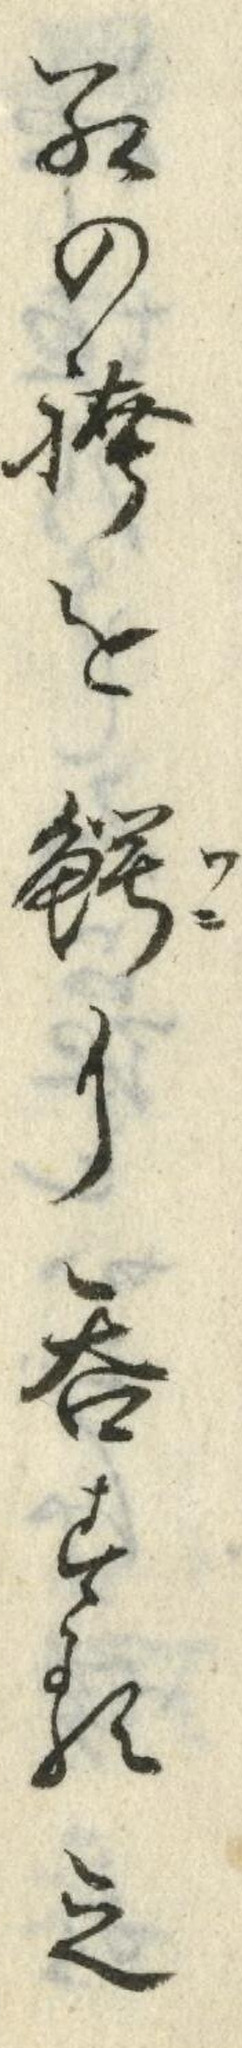紅の袴を鰐に呑する之
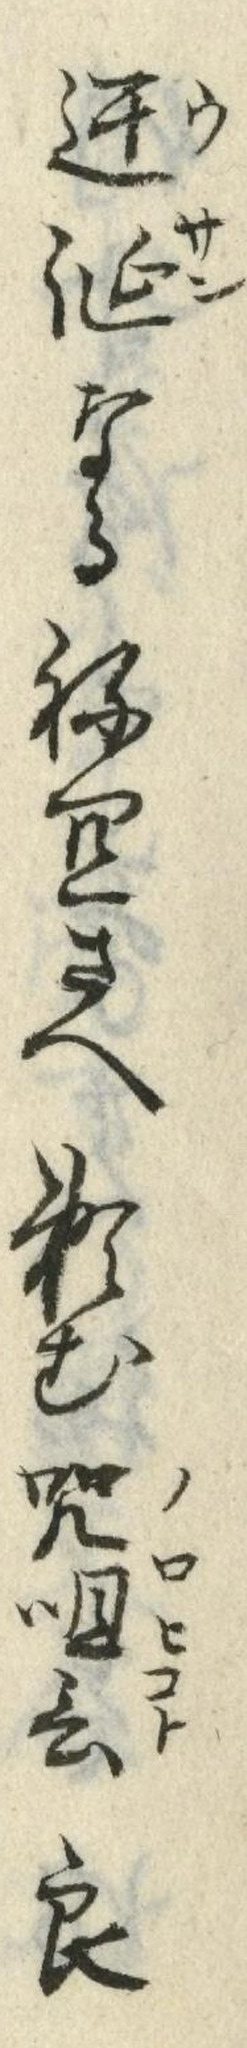迂涎なる祢宜さへ頼む呪詛言良
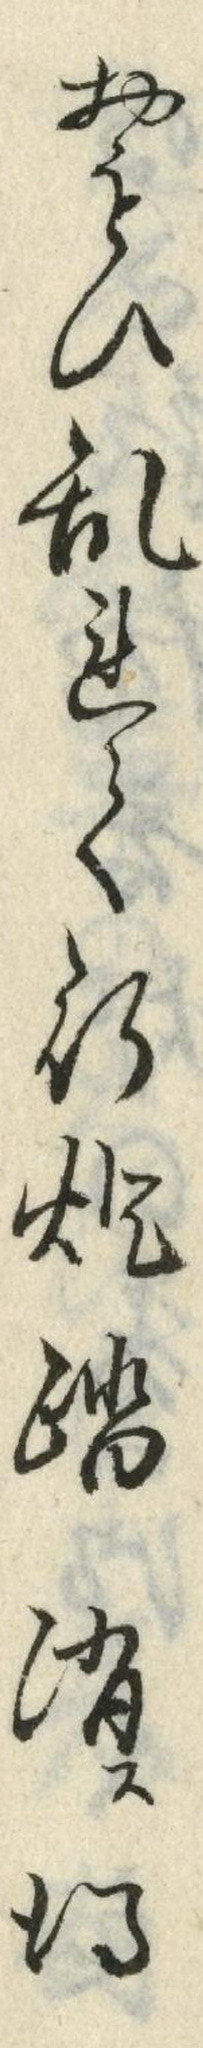おもひ乱れて行灯踏消ス得
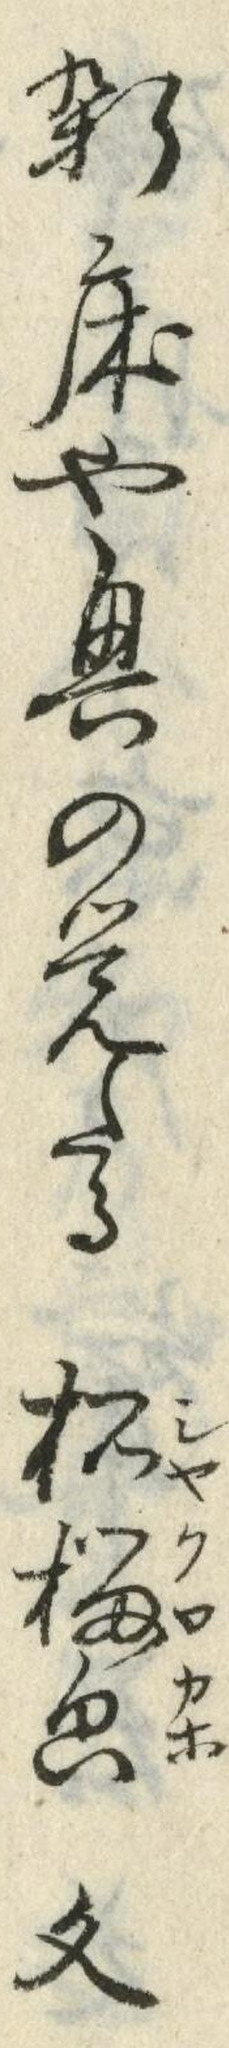新床や奥の覚たる柘榴貌文
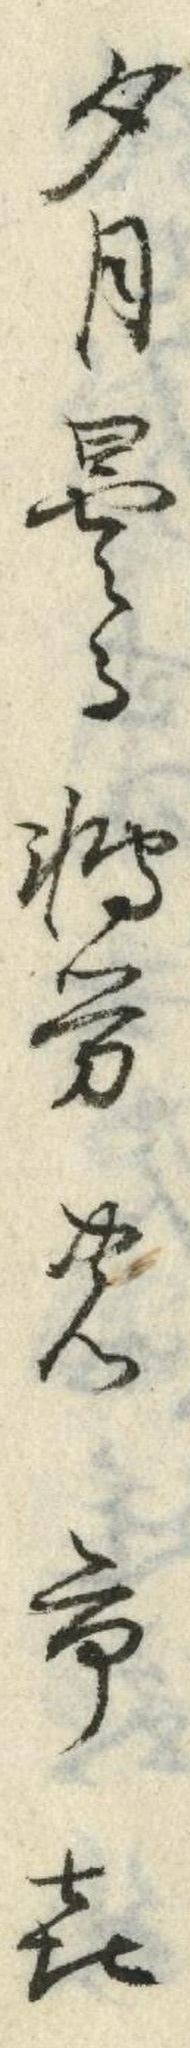夕月曇る博労の市喜
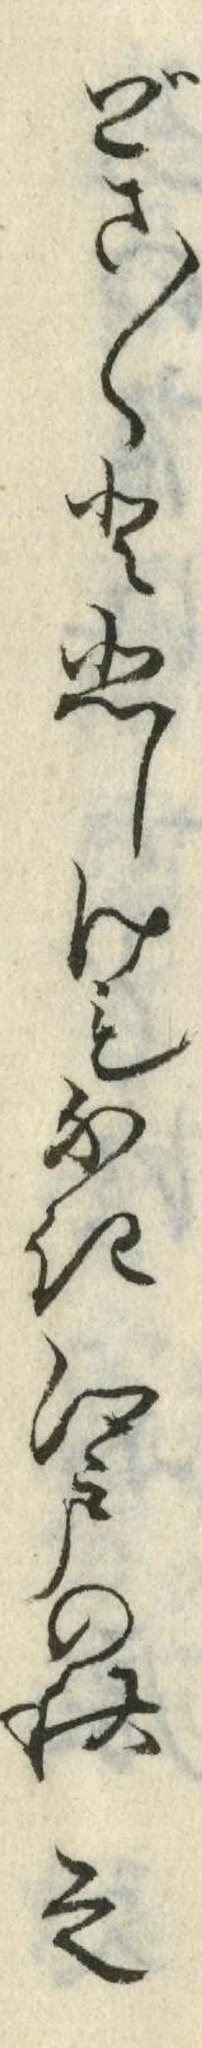どこ〳〵と悲しけもなき江戸の秋之
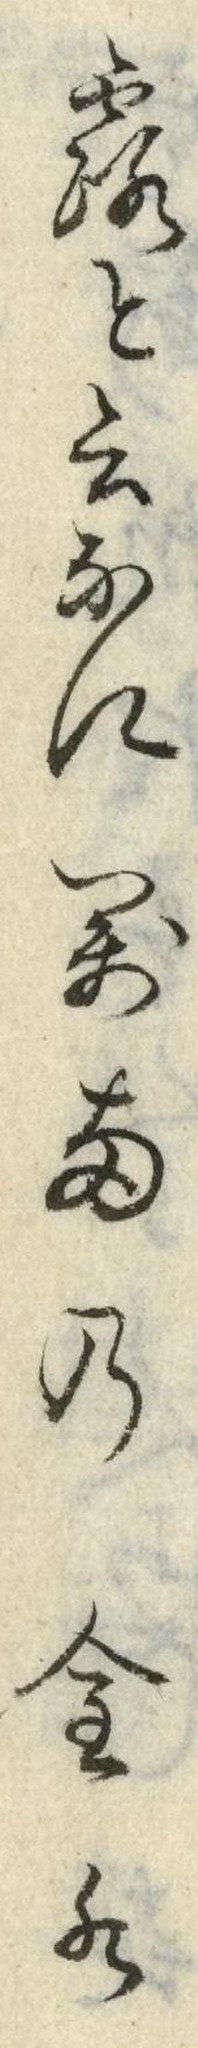露と云なに万両の金水
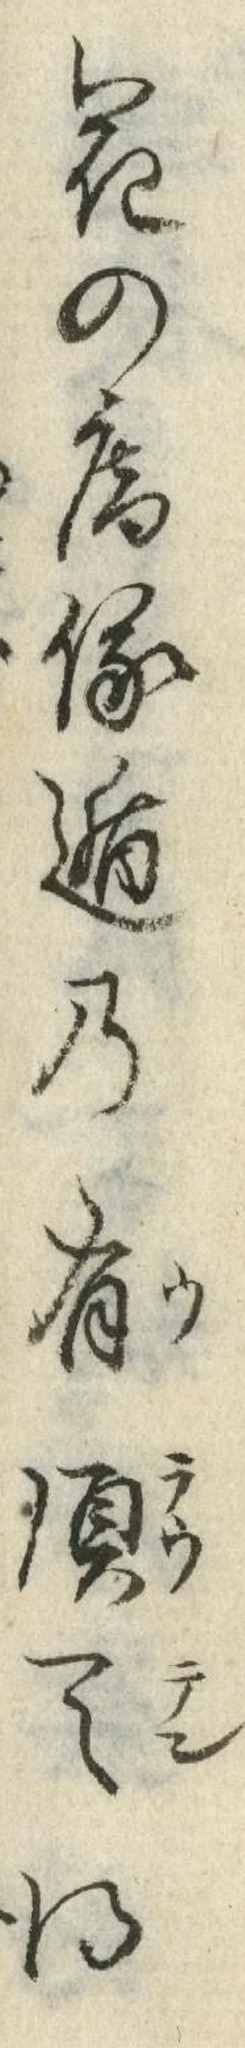花の庵俄遁の有頂天得

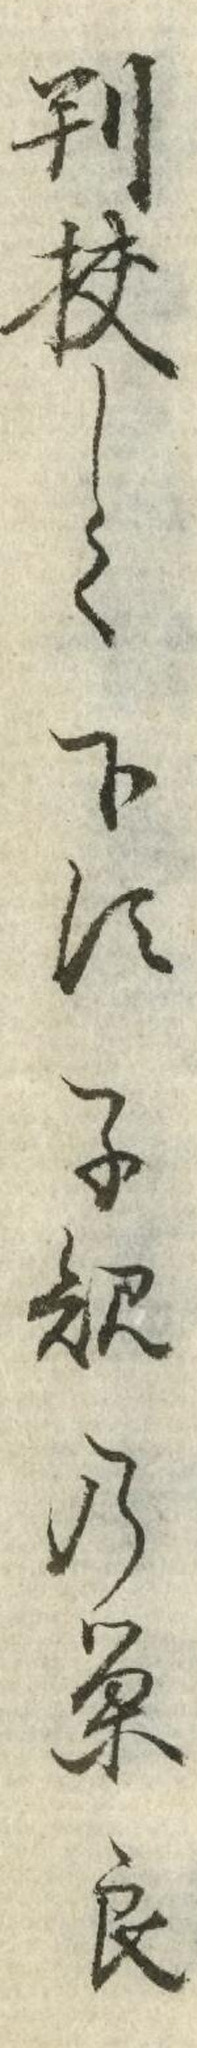判挟して下す子規の巣良
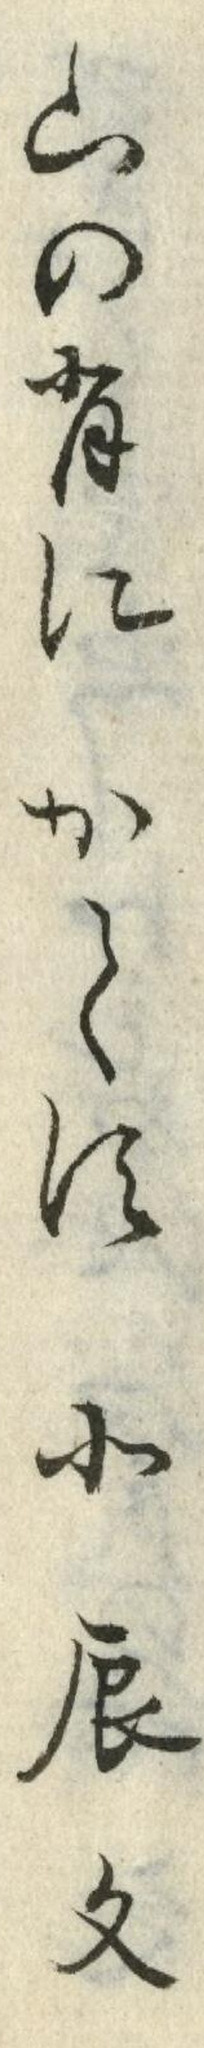山の背にかくす北辰文
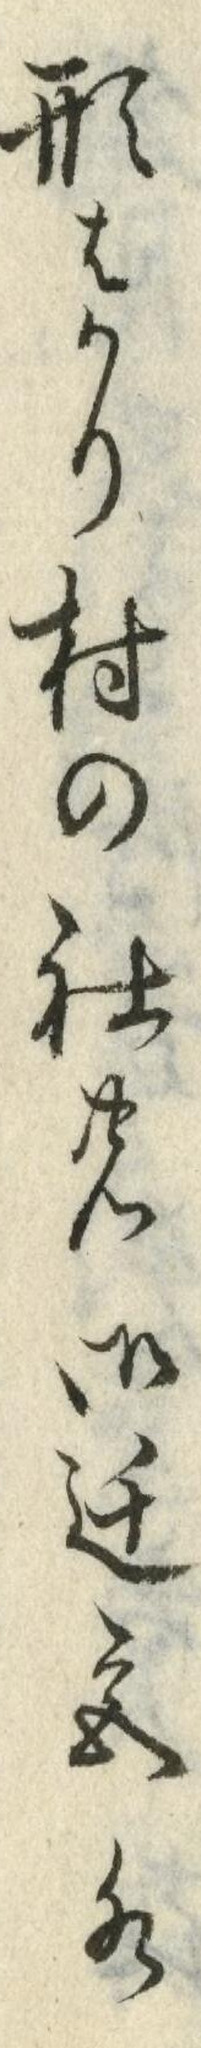形はかり村の社の御遷宮水
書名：誹諧　能登釜
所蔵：Ishikawa Prefectural Library
